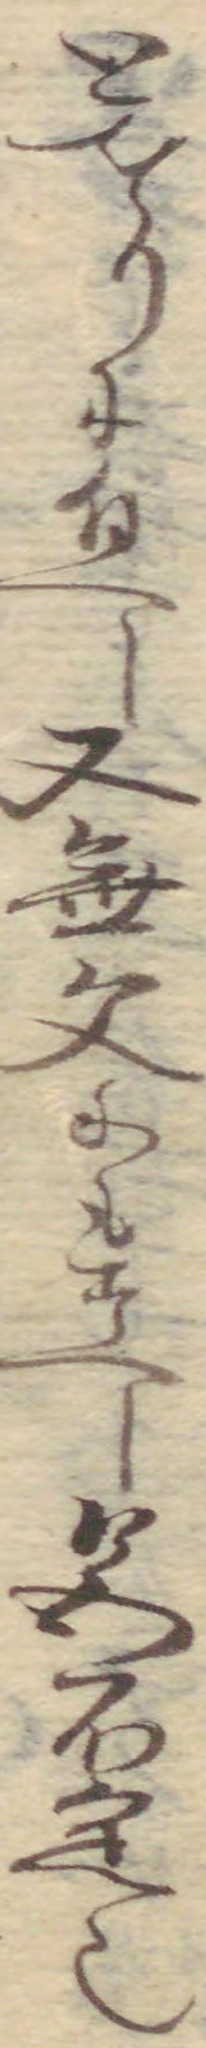とをりに付へし又無文にもすへし色不定也
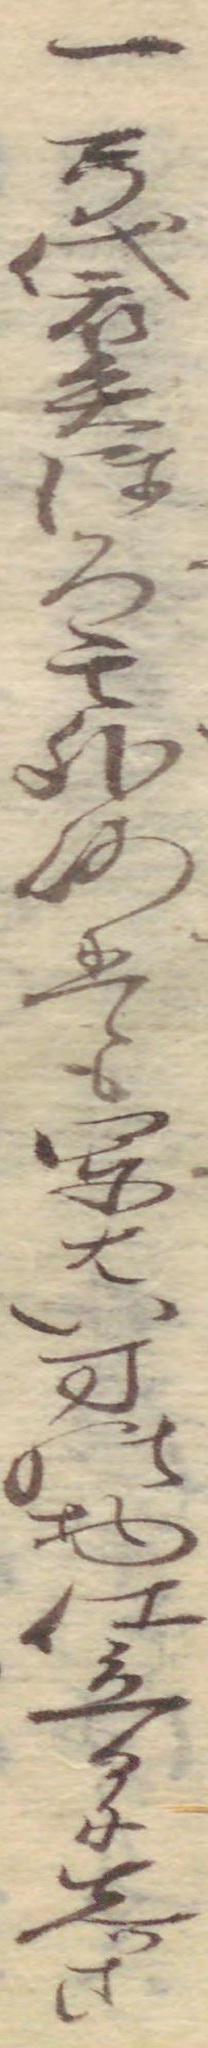一弓袋矢ほろ其外何にても軍はい方の物仕立るに先ツさ
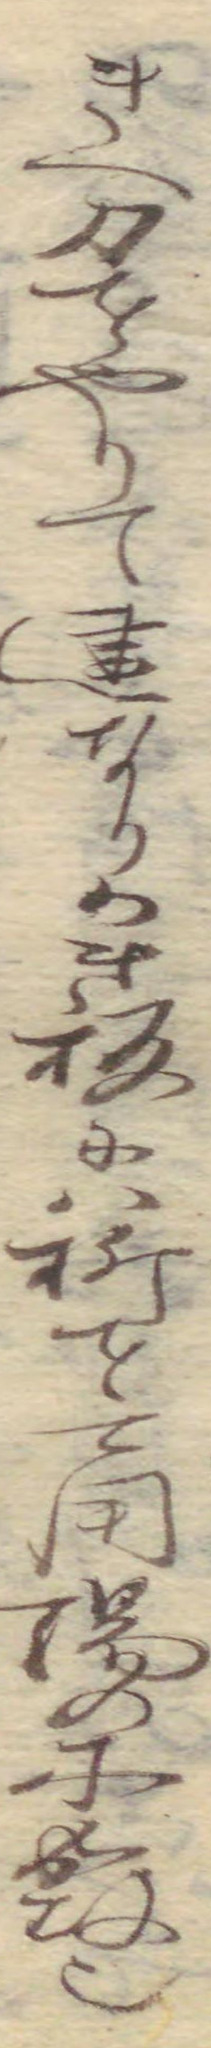きへ刀をやりて建なりかき板にハ柳を可用陽の木成故也
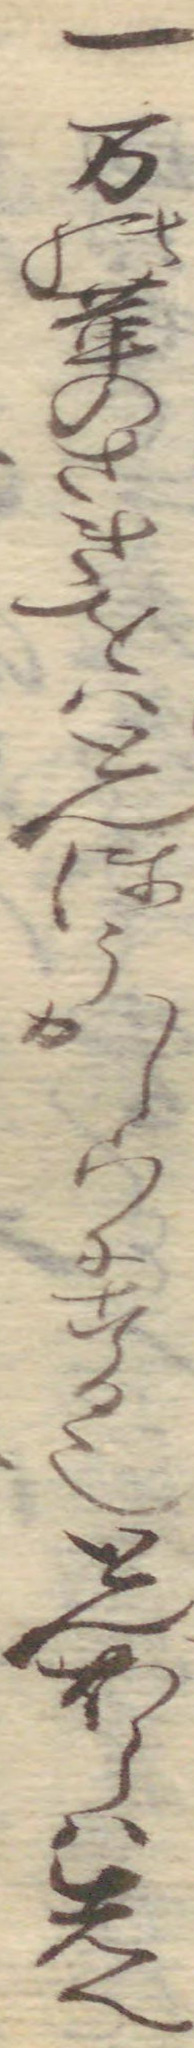一万の革のさきをハとんほうかしらにする也とんほうハ先へ
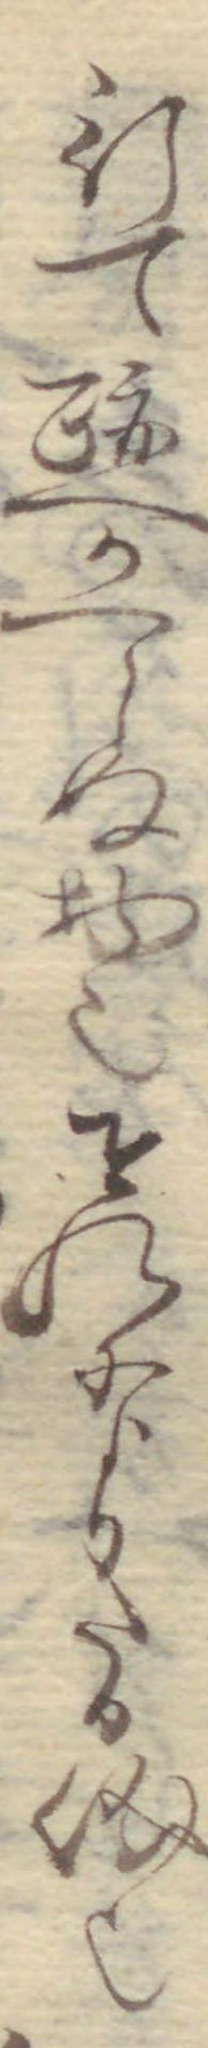行て跡へかへらぬ物也それによりたる儀也
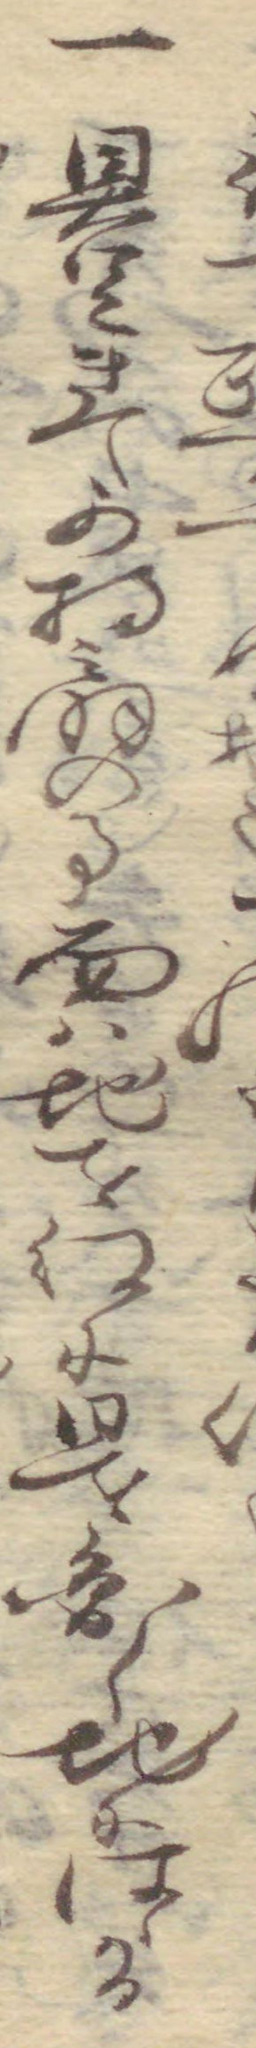一具足きて可持扇の事面ハ地を紅に日を円く地にはゝかる
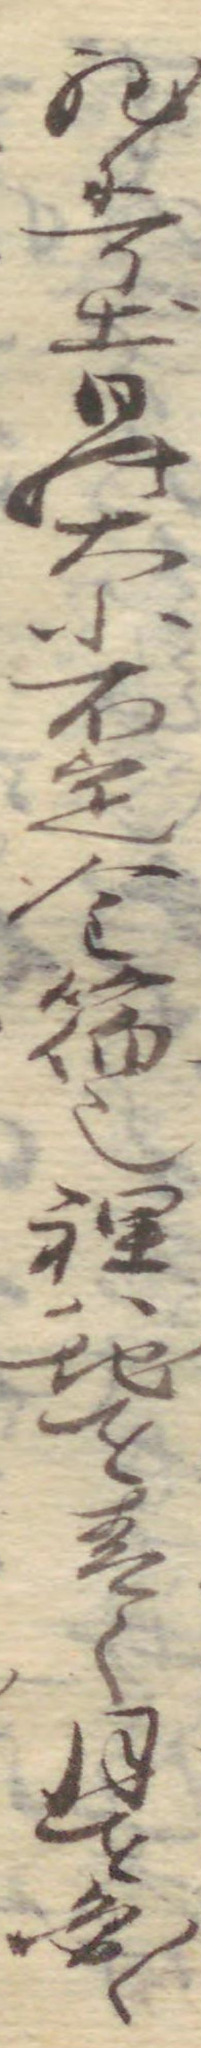程に可出日の大小不定金箔也裡ハ地を青く月を円く
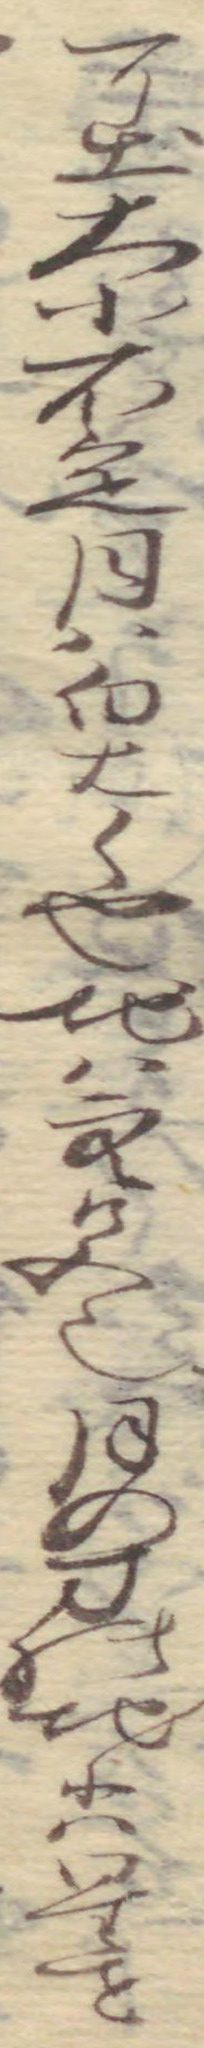可出大小不定月ハ白はく也地ハ空色也月の方の地にハ星を
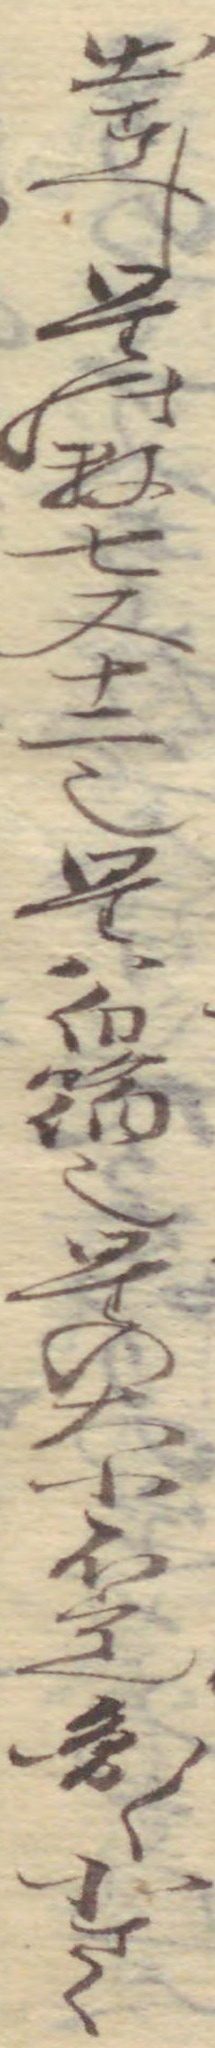出すへし星の数七又十二也星ハ白箔也星の大小不定円く小さく
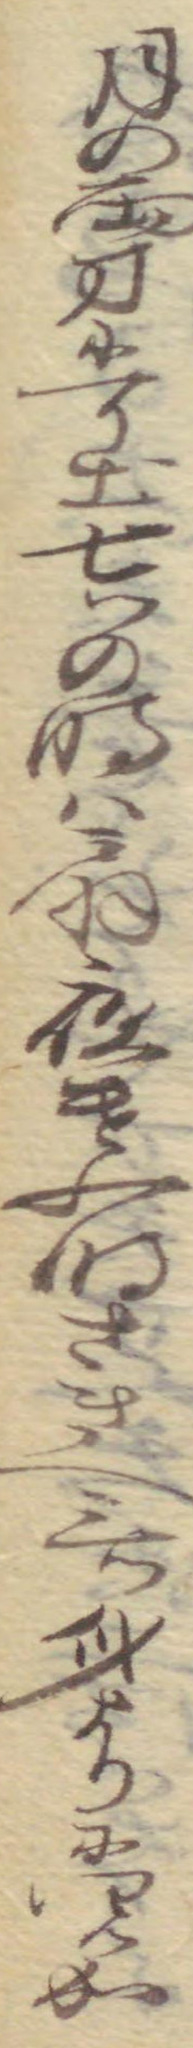月の両方に可出七ツの時ハ扇夜遣ふ時さきへ三ツ身よりに四ツ成
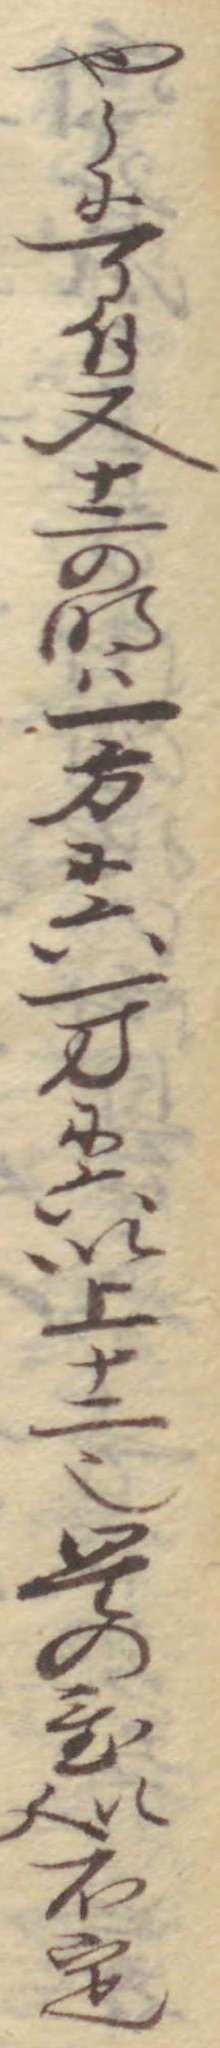やうに可付又十二の時ハ一方に六一方に六以上十二也星の置処不定
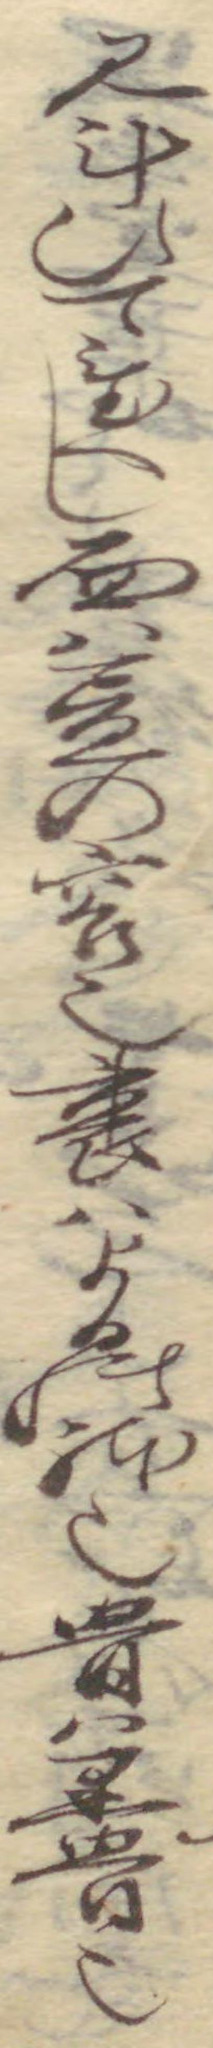見斗ひて置へし面ハ昼の容也裏はよるの体也骨ハ黒骨也
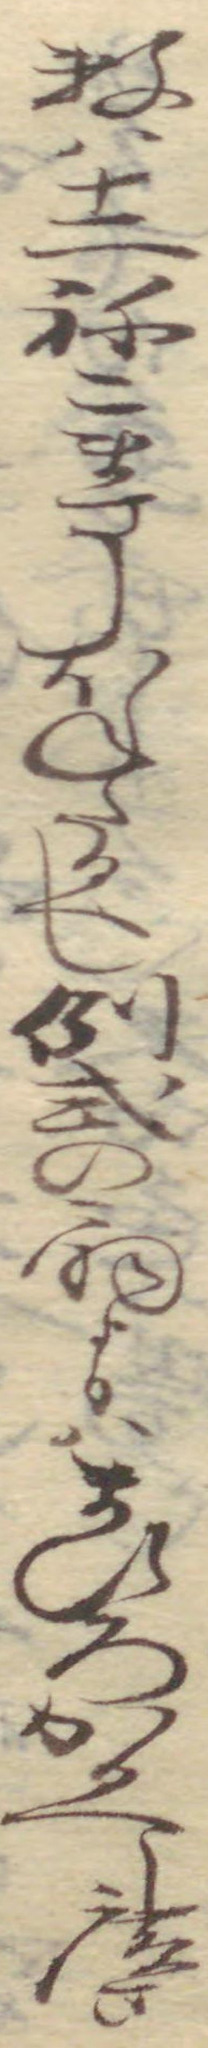数ハ十二ねこまさしほ手たるたるへし例式の扇よりハまひろかるへし広き
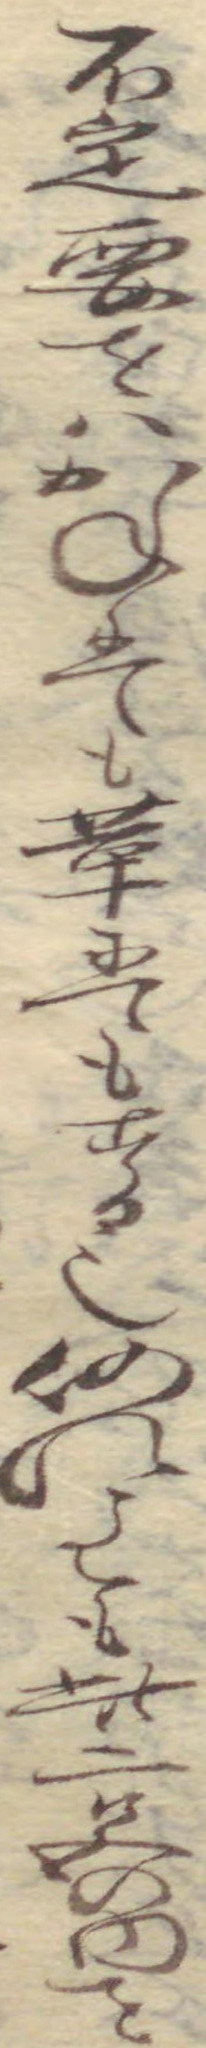不定要をハかねにても革にてもする也何れニても此二色の内を
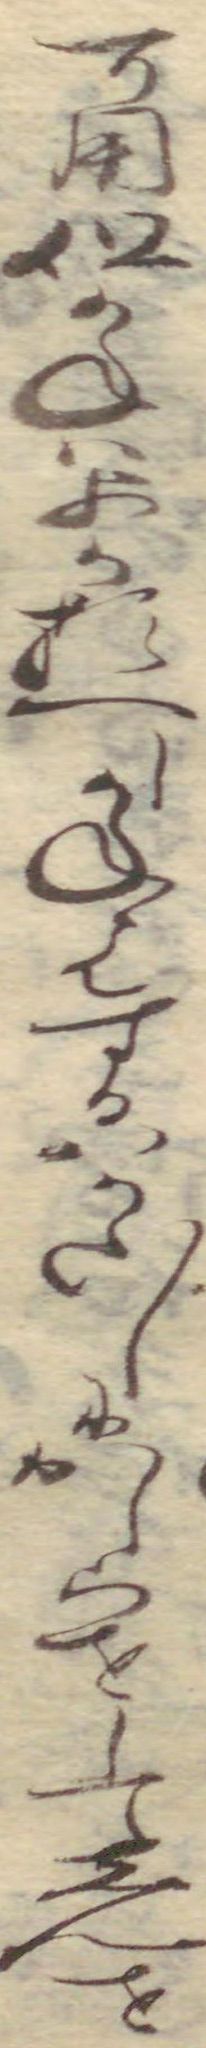可用但かねハよかるへしかねニてするハかた〳〵にかしらをしてしんを
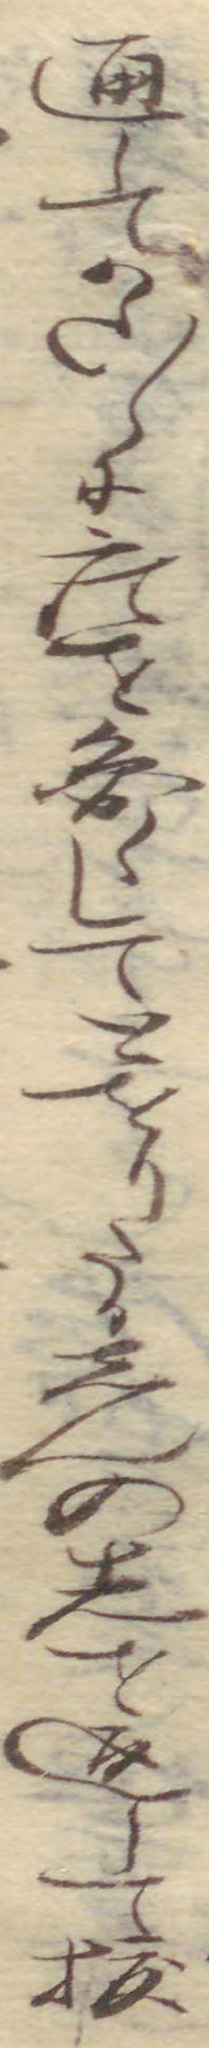通してかた〳〵に座を円くしてとおりたるしんの先を返して抜
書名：鶯宿雑記. 巻199-200
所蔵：国立国会図書館 National Diet Library, JAPAN
